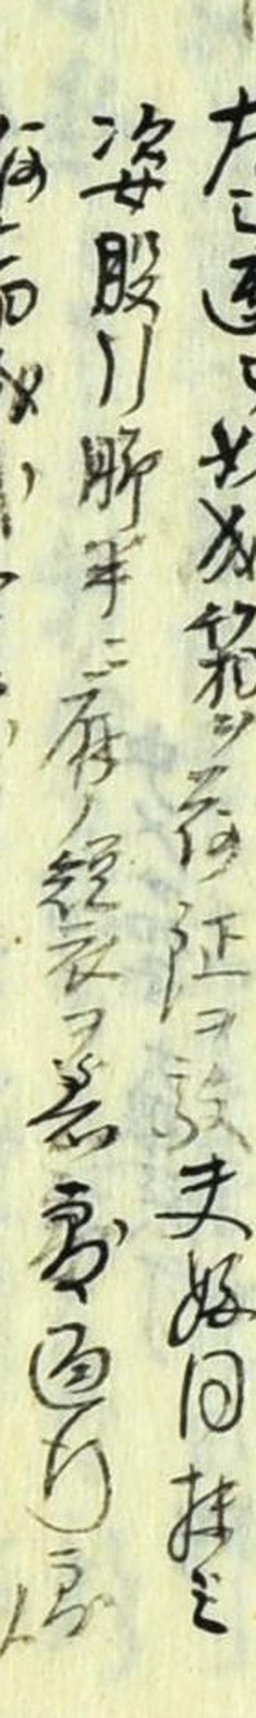姿股引脚半ニ麻ノ短衣ヲ着致通行致候
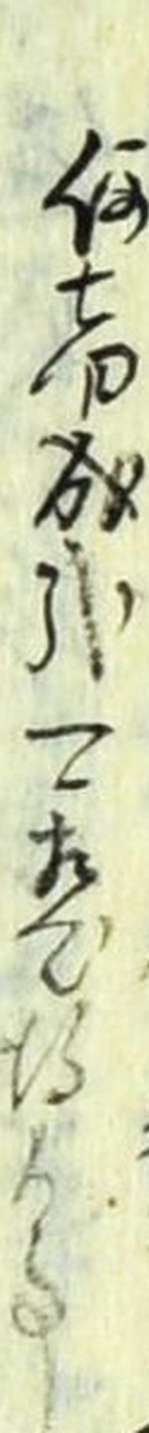何物成哉可相心得候事

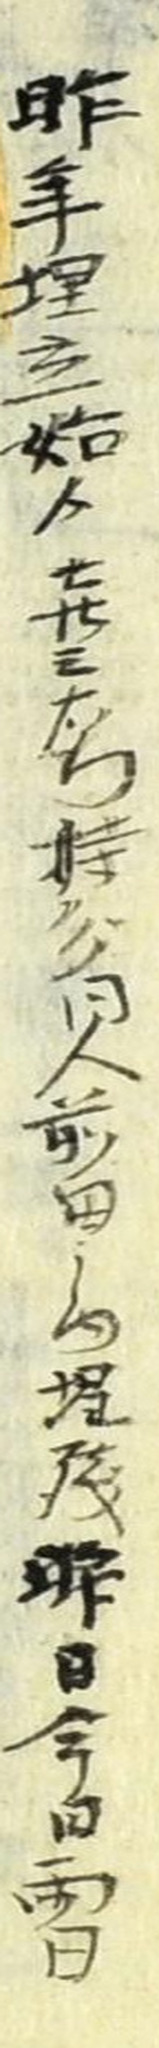昨年埋立始候喜三右衛門持分同人前田之内埋残昨日今日両日
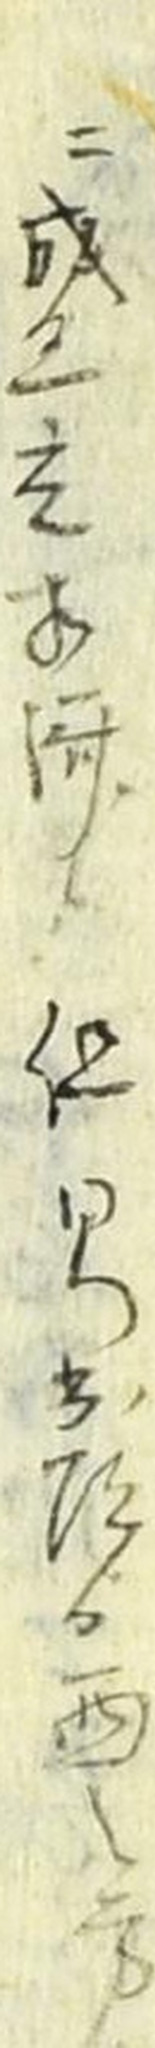ニ盛立相済候但同人出道ゟ西之方ナリ
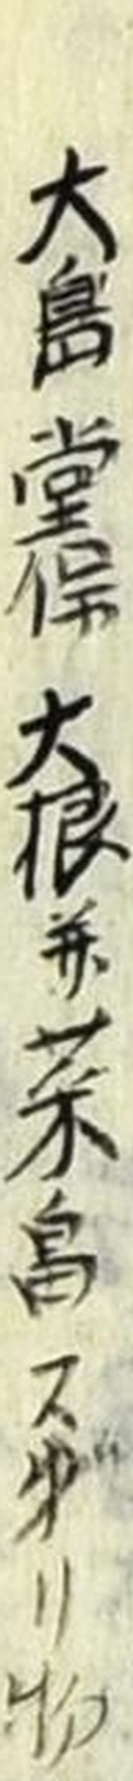大島堂保大根幷菜畠スグリ物仕
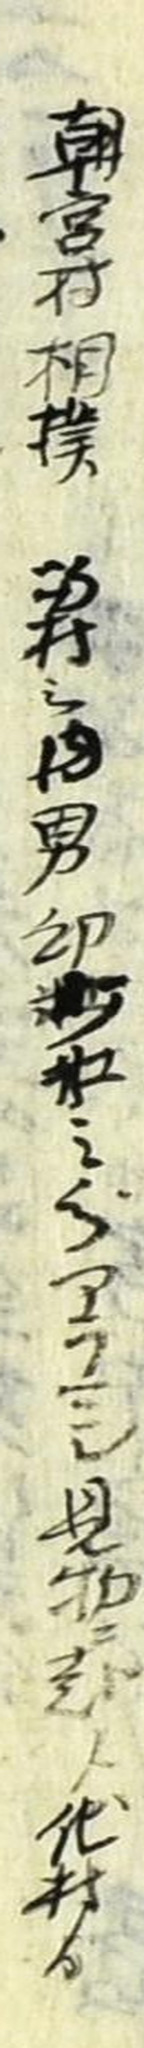朝宮村相撲当村之内男幼少壮之分アラマシ見物ニ赴候他村ゟ
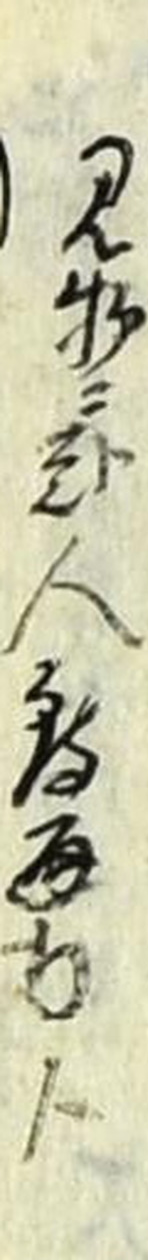見物ニ赴人致通行候
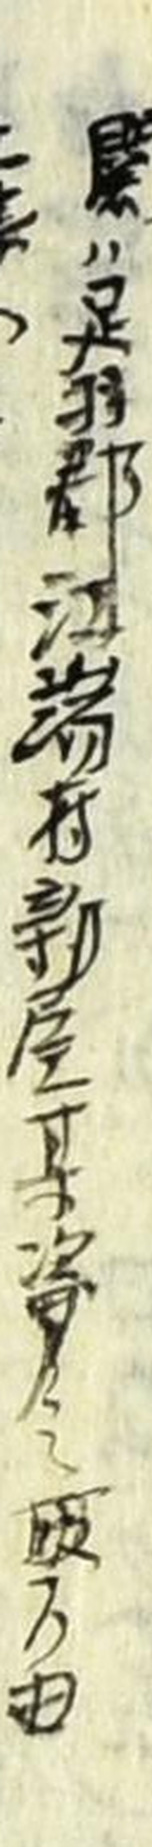関ハ足羽郡江端村新屋某次男之取候由
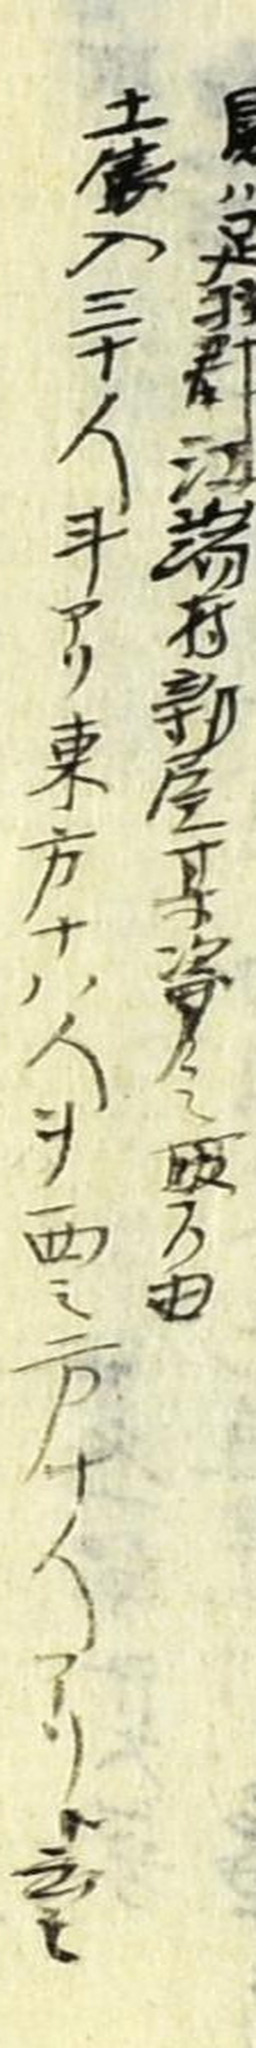土俵入三十人計アリ東方十八人計西之方十人アリト云々
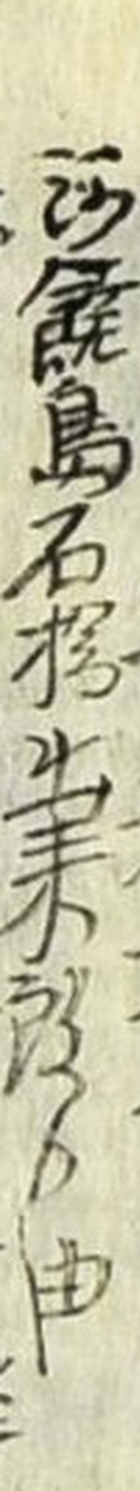河饒島石橋出来致候由
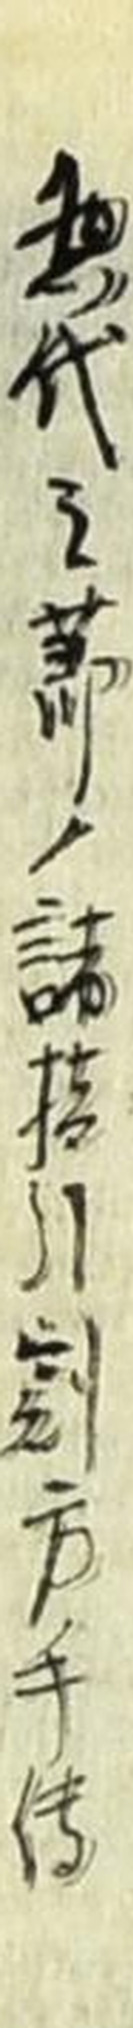惣代之節ノ諸指引割方手伝
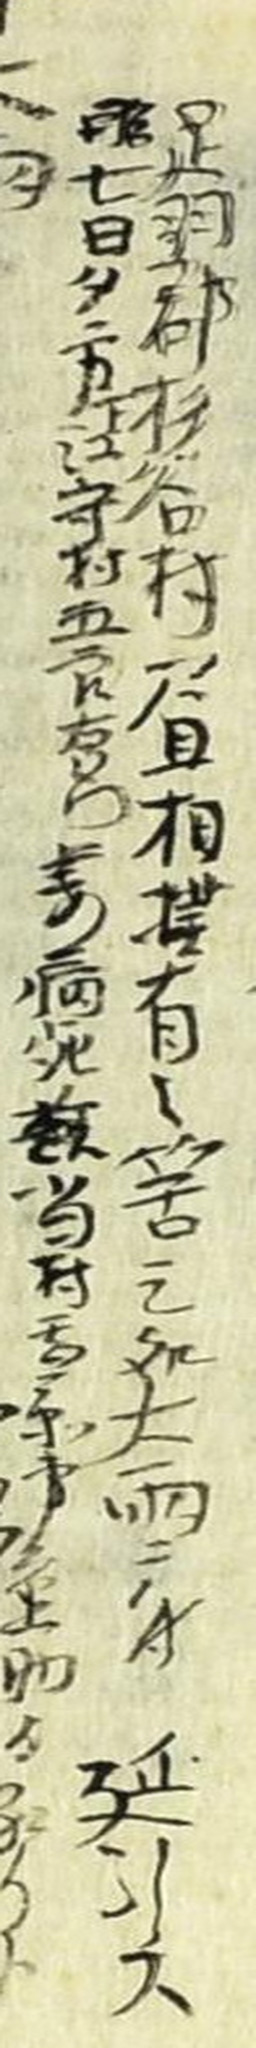昨七日夕方江守村五郎右衛門妻病死致当村甚兵衛方金助ゟ承リ候
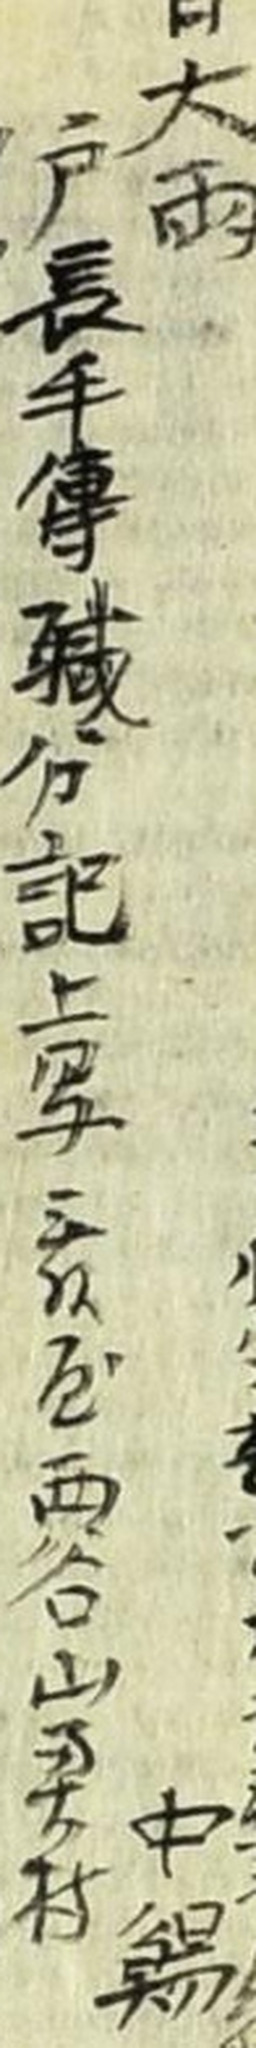戸長手伝職分記上写舞屋西谷山奥村
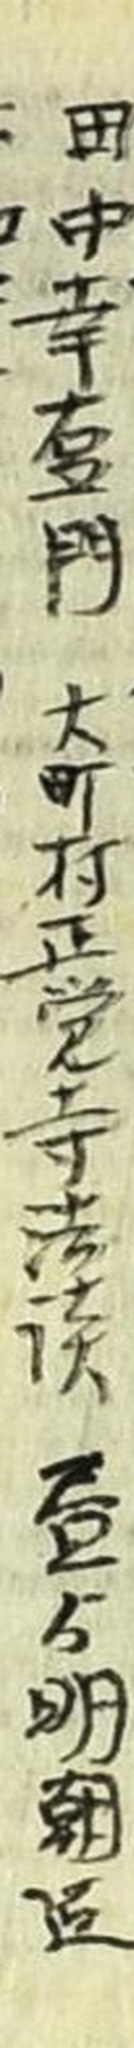田中幸右ヱ門大町村正覚寺法談昼ゟ明朝迄
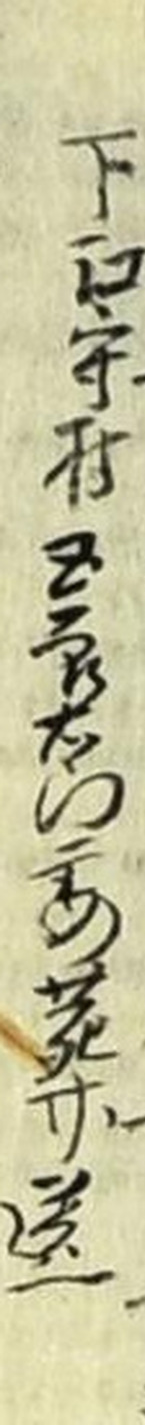下江守村五郎右衛門妻葬送
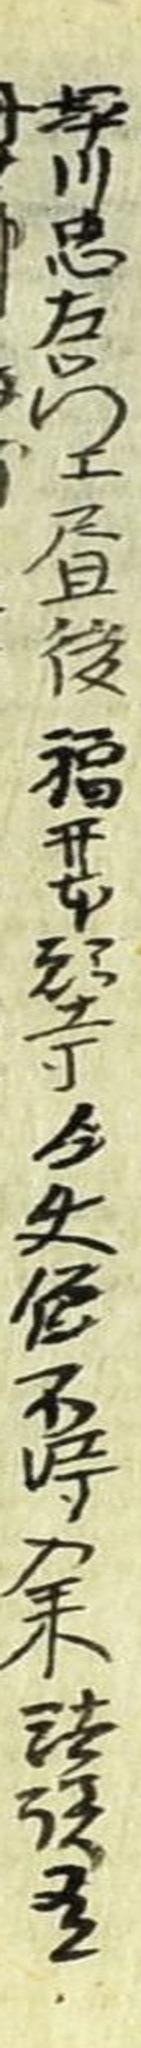坪川忠左衛門エ昼後福井本願寺ゟ使僧不時入来法談有
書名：（日記）
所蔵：福井県文書館 Fukui Prefectural Archives
